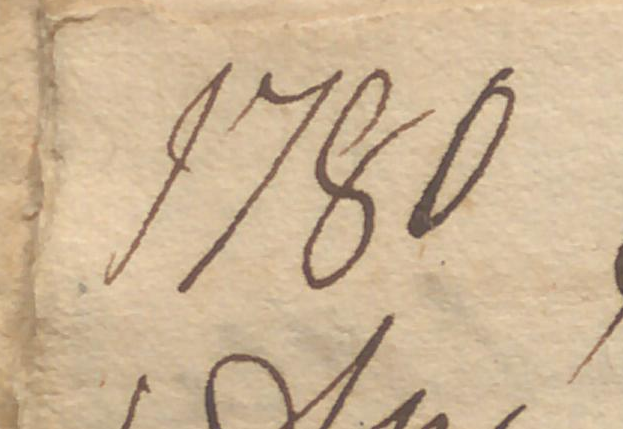1780
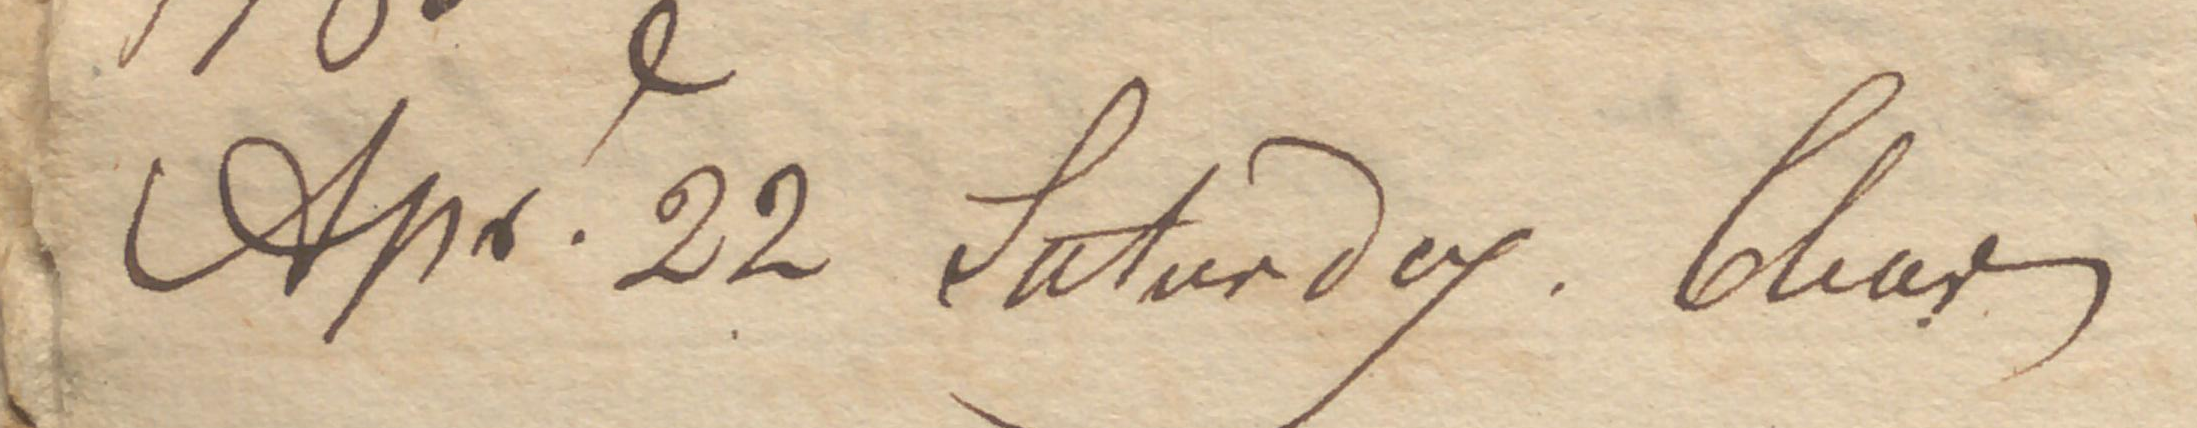Apr^l. 22 Saturday. Clear
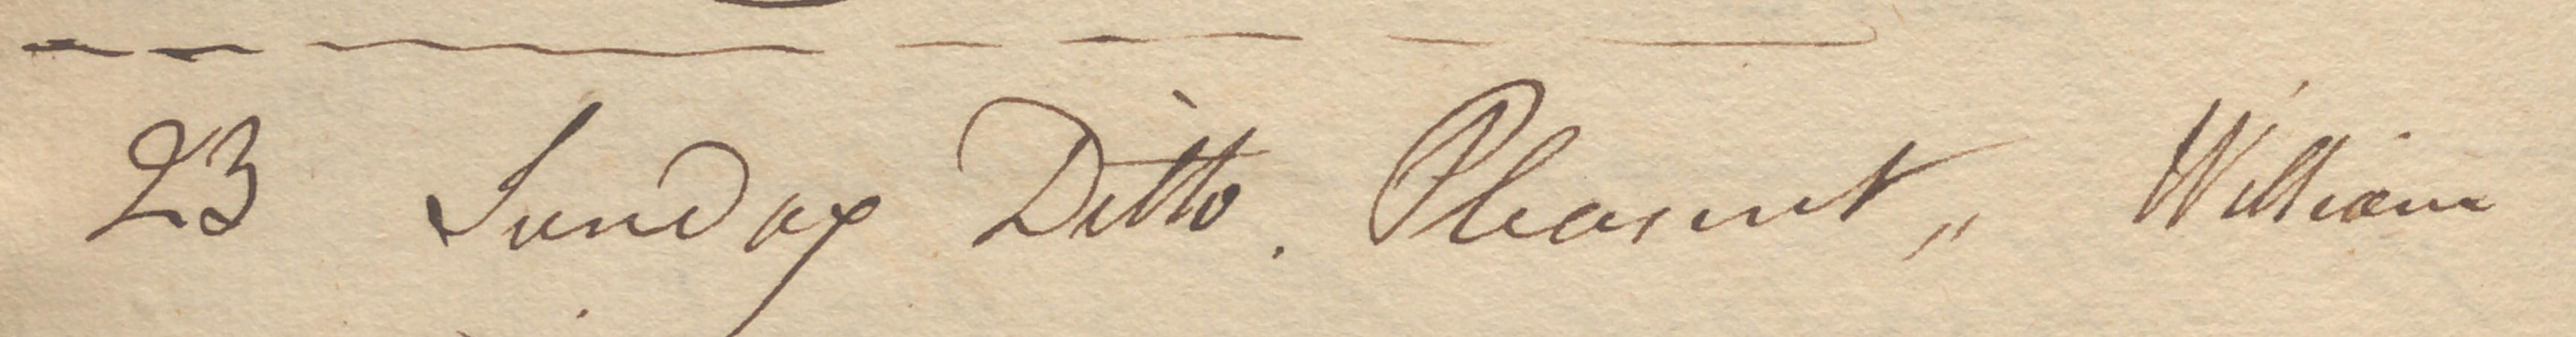23 Sunday Ditto Pleasent, William
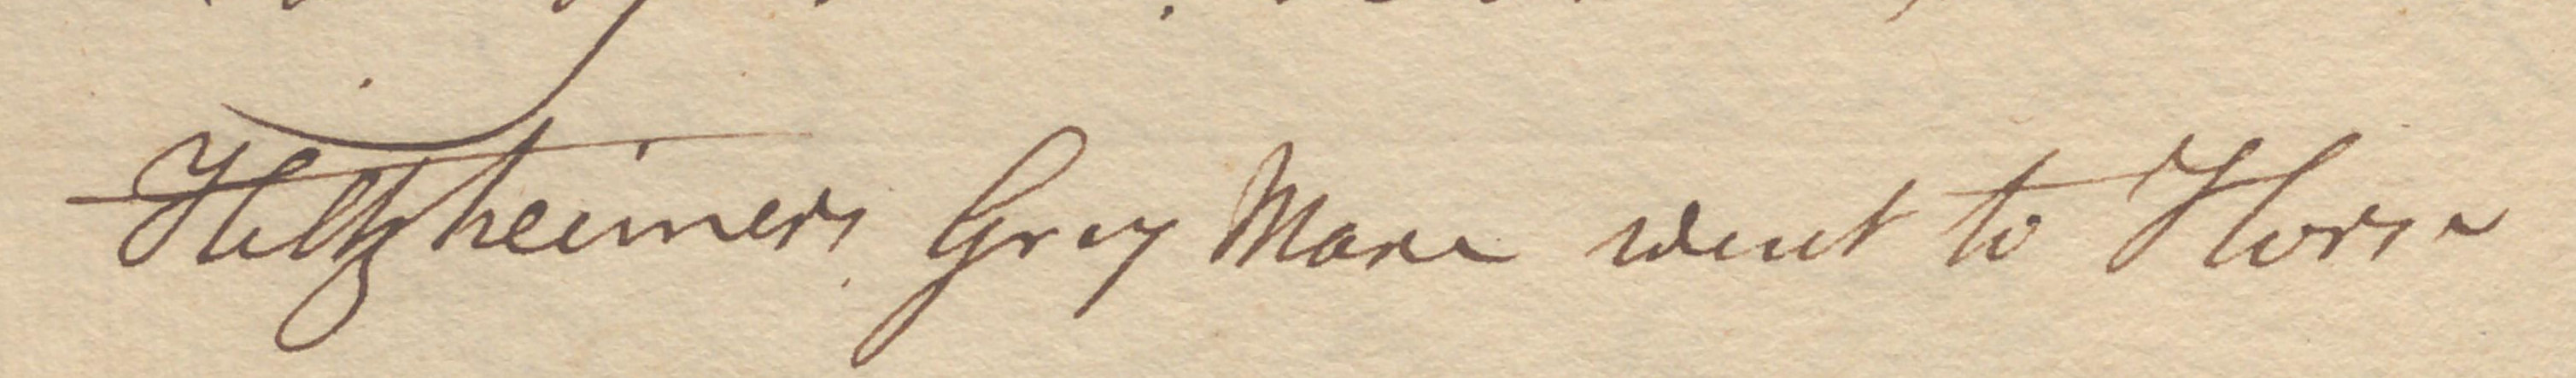Hlzheimers Grey Mare went to Horse
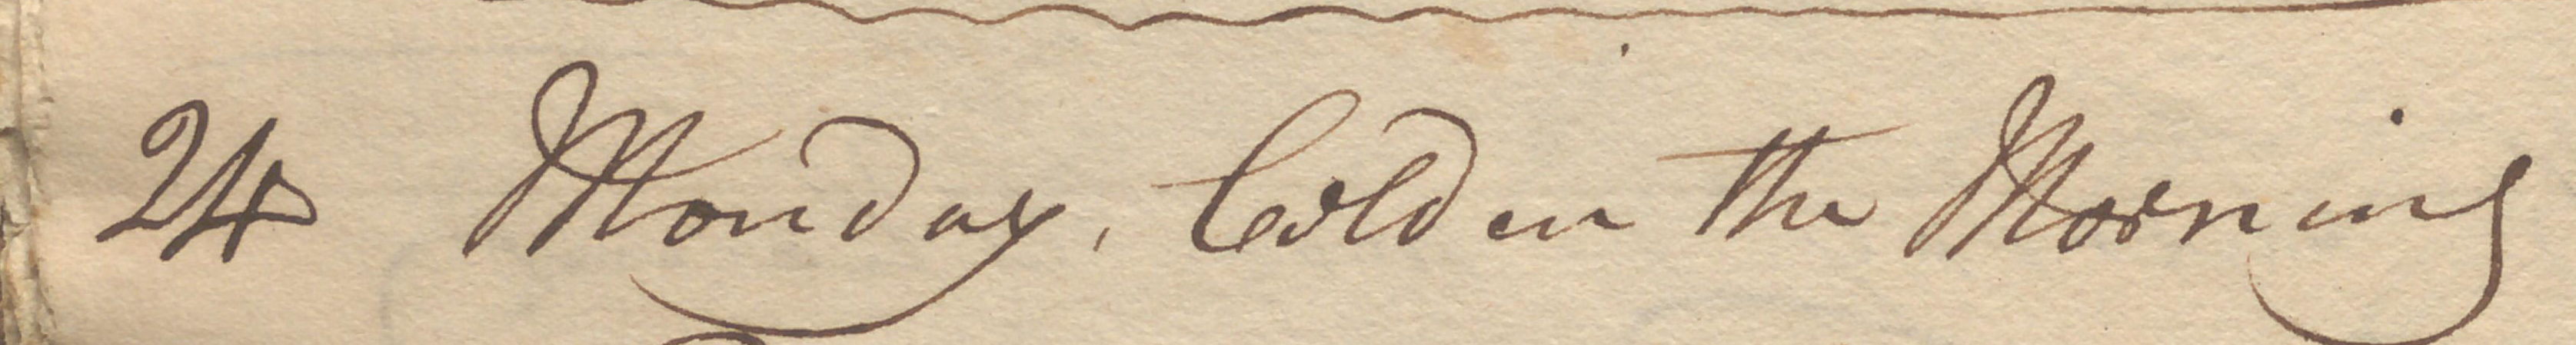24 Monday. Cold in the Morning
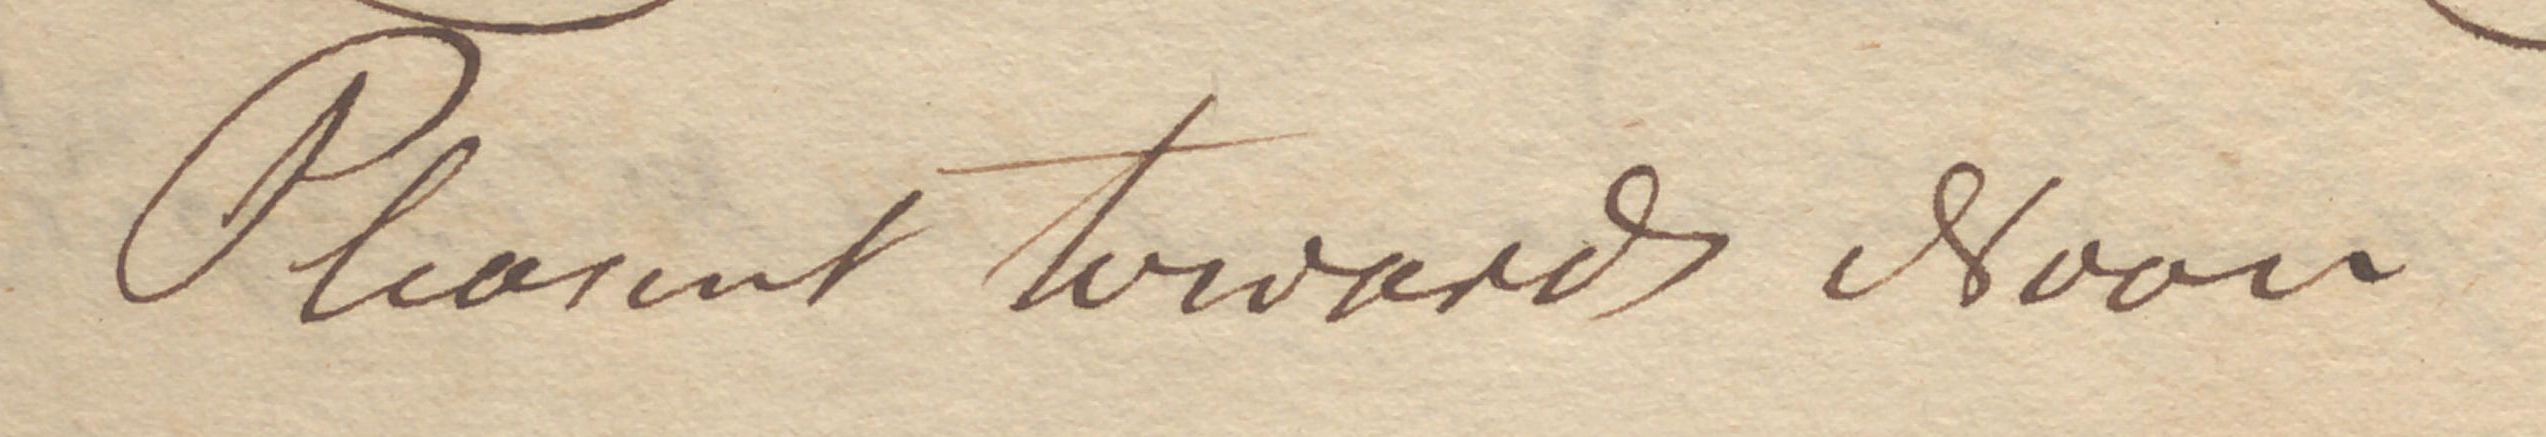Pleasent towards Noon
